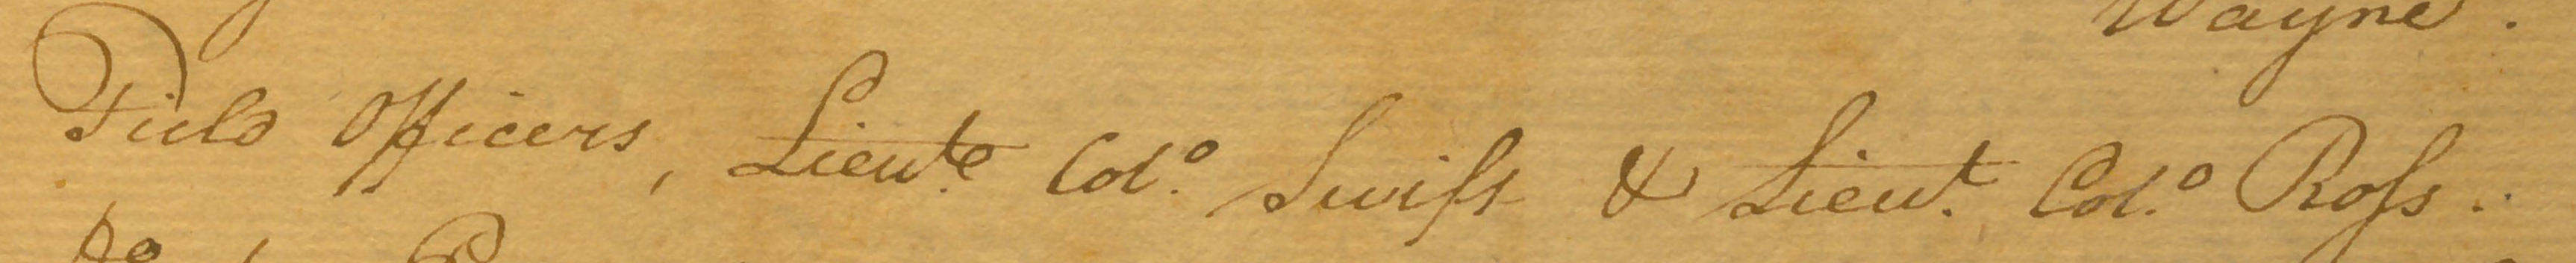Field Officers, Lieu^t. Col^o. Swift & Lieu^t. Col^o. Ross
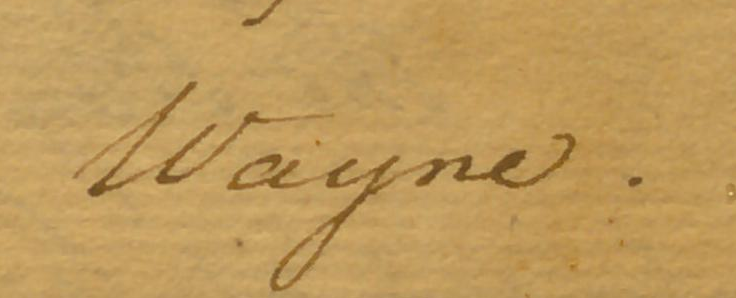Wayne.
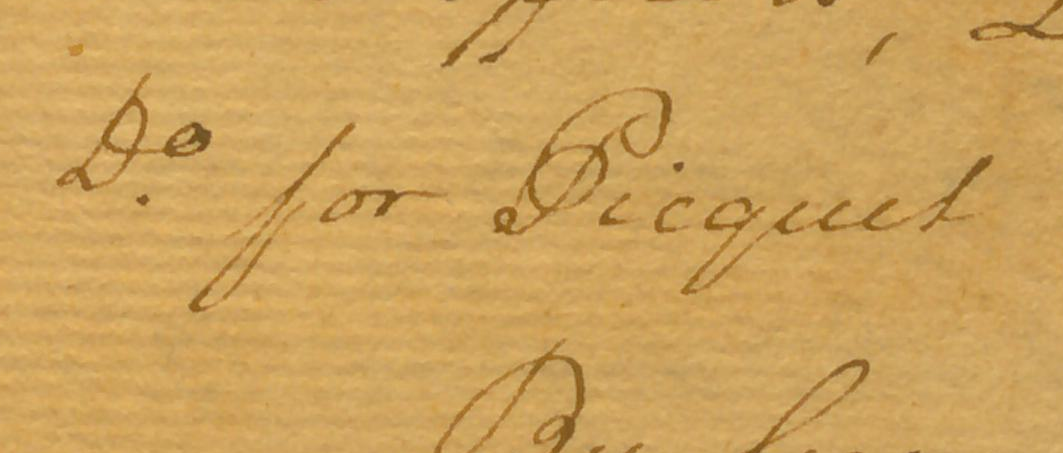D^o. for Picquet
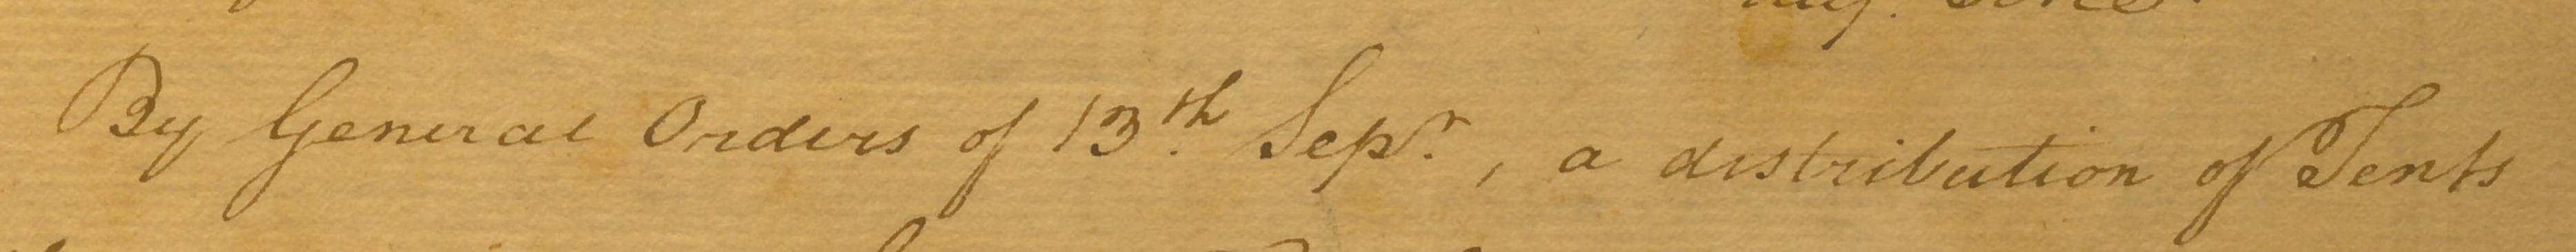By General Orders of 13^th. Sep^r., a distribution of Tents
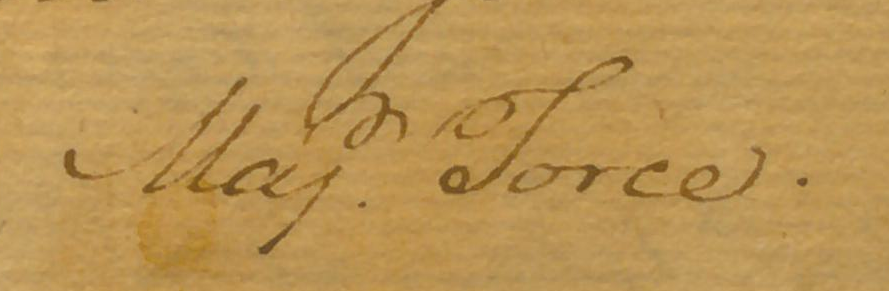Maj^r. Force
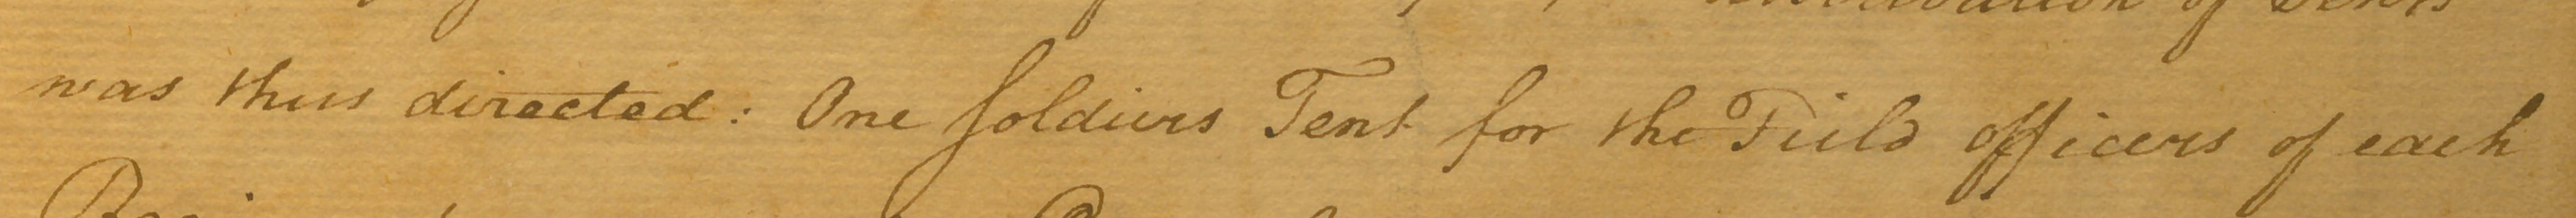was thus directed: One Soldiers Tent for the Field officers of each
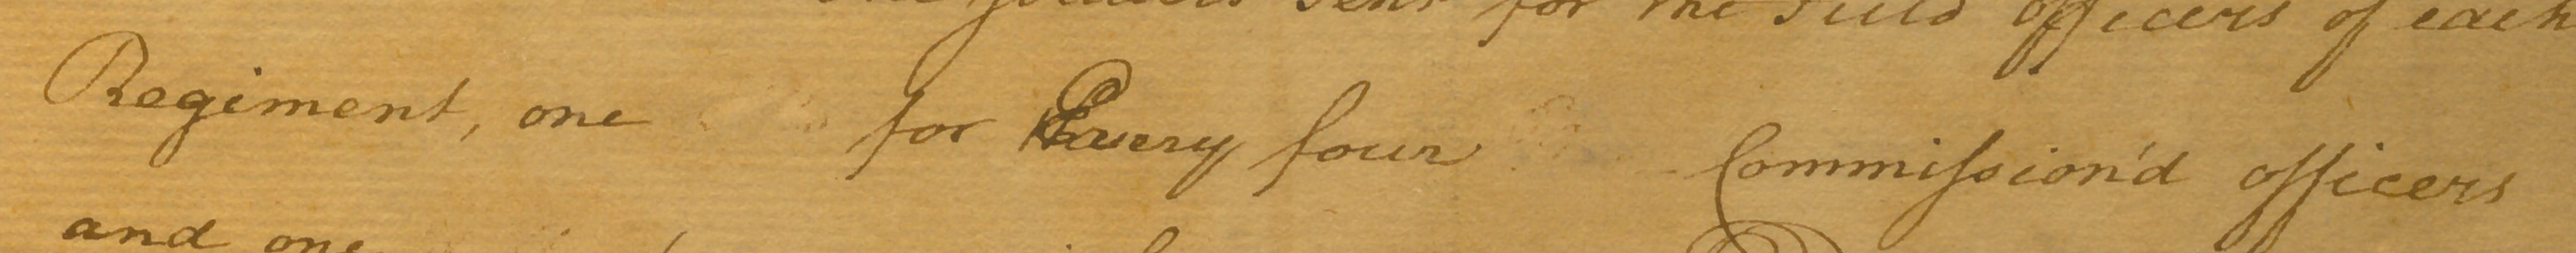Regiment, one for Every four Commission'd officers
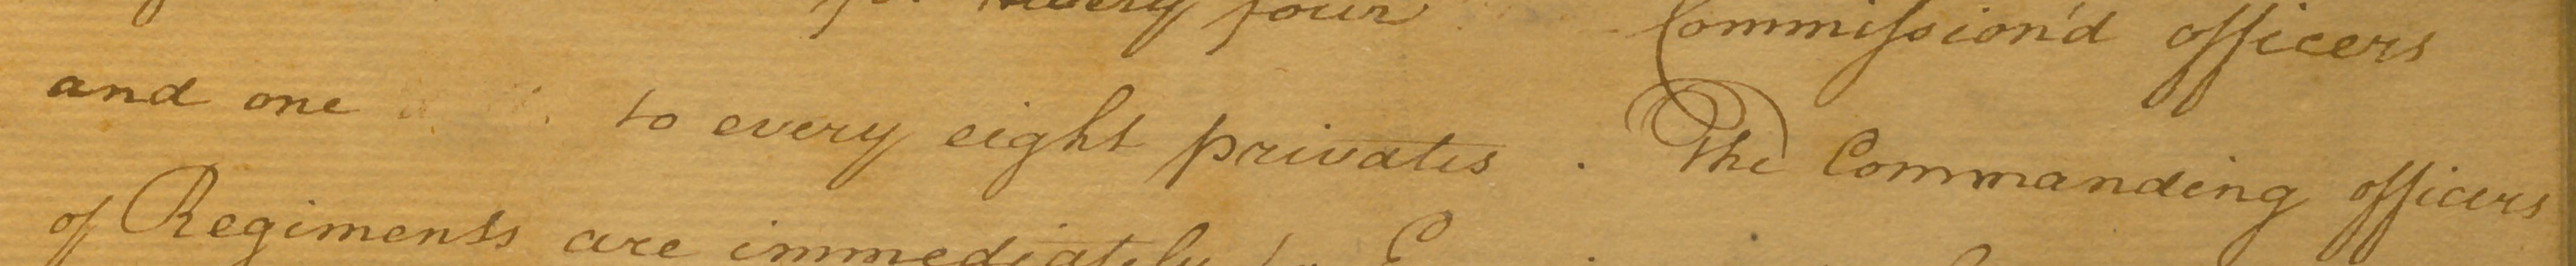and one to every eight privates. The Commanding officers
